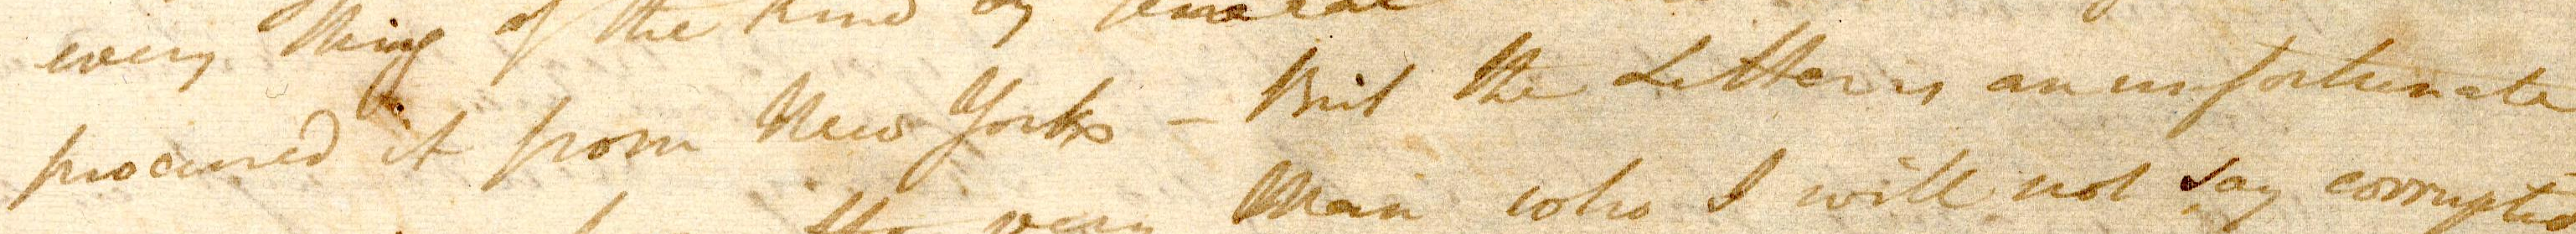procured it from New York. But the Letters an unfortunate
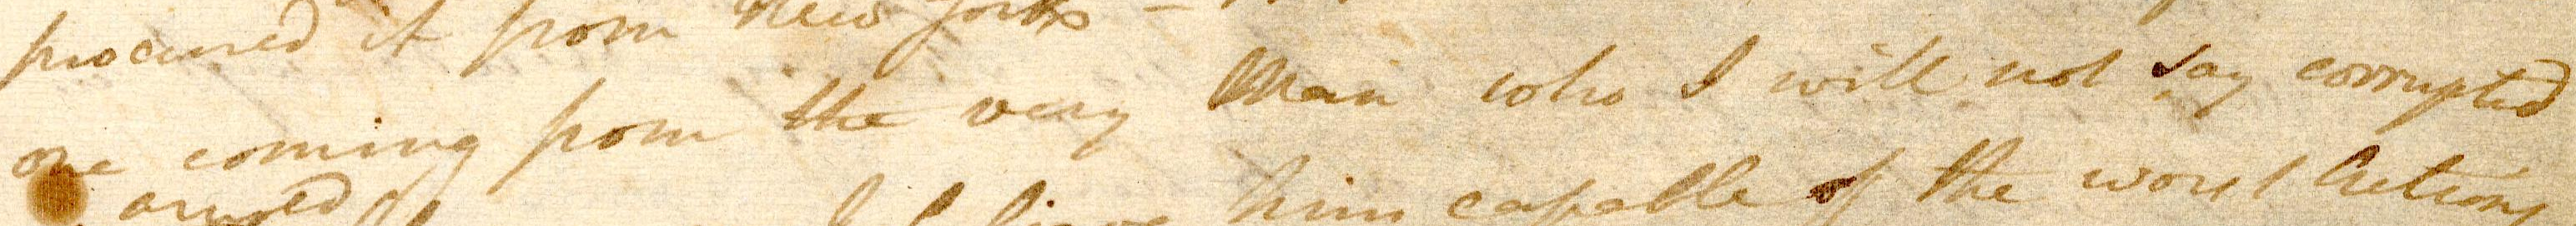one coming from the very Man who I will not say corrupted
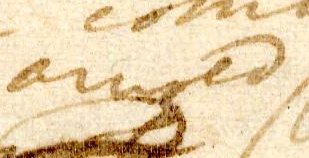owned
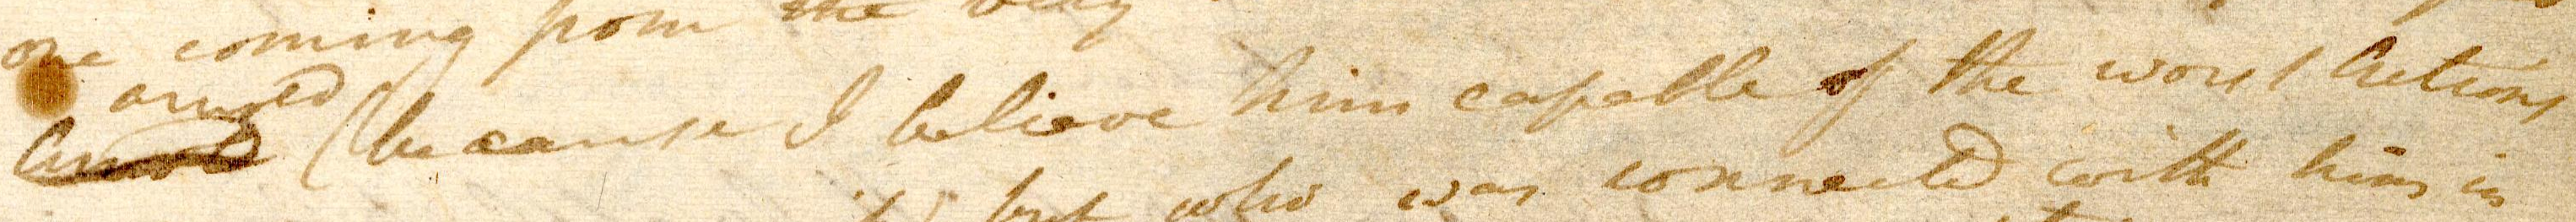Arnold (because I believe him capable of the worst Actions
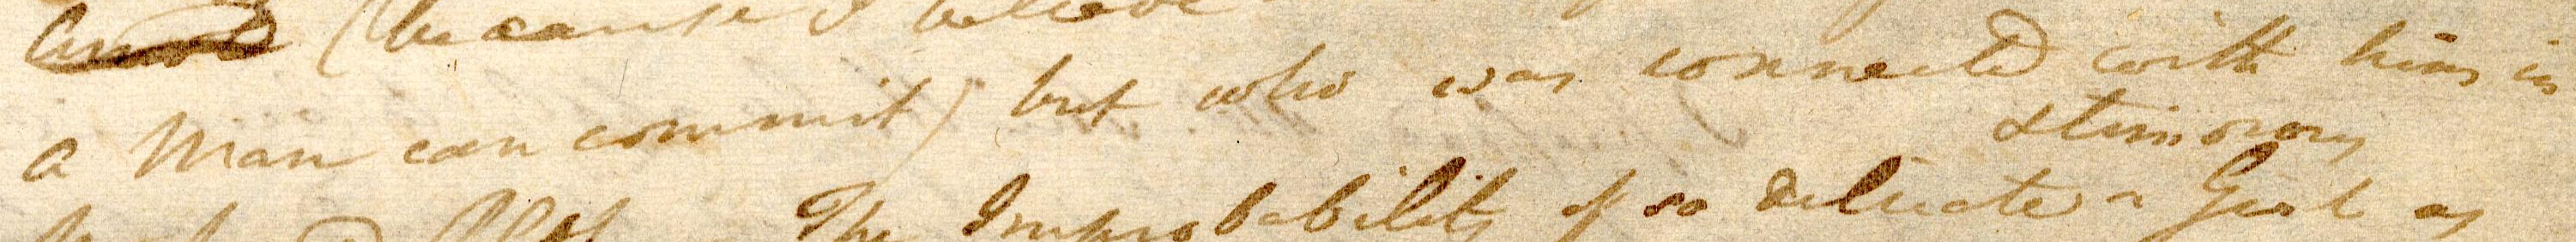a Man can commit) but who was connected with him in
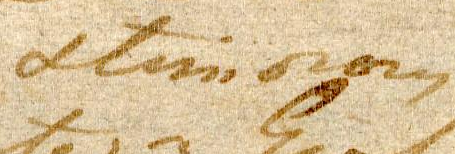timorous
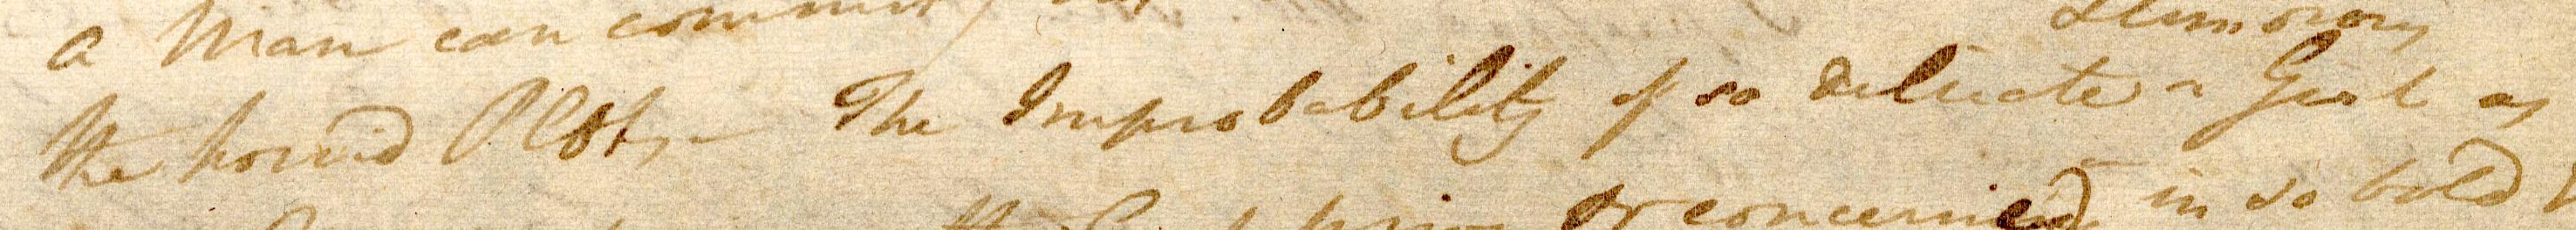the horrid Plot. The Improbability of so delicate ^ Girl as
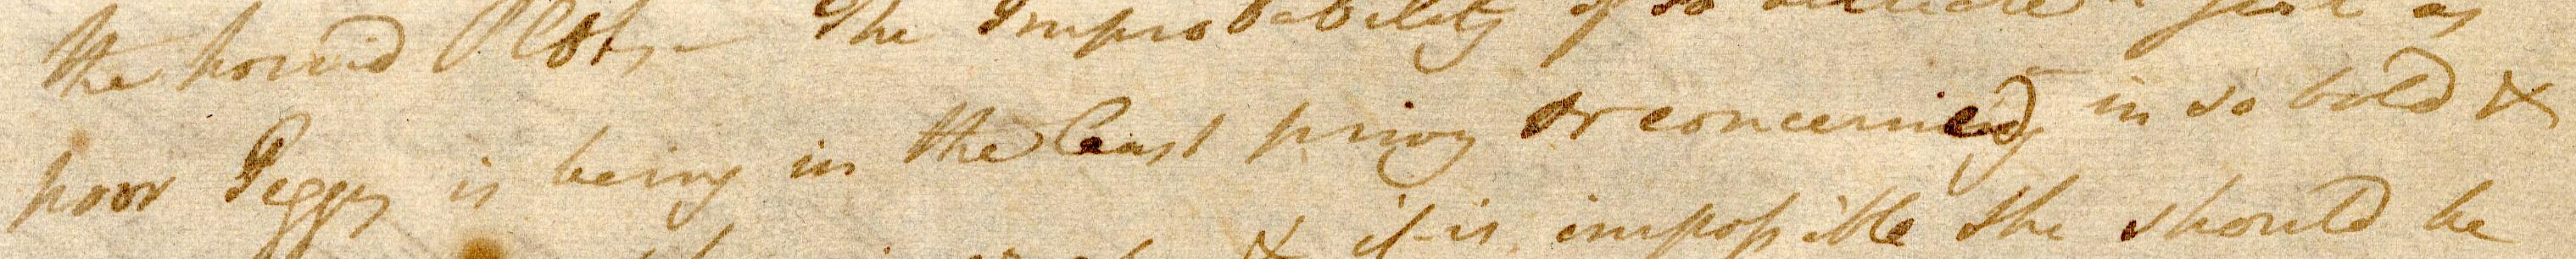poor Peggy is being in the least privy or concerned in so bold &
